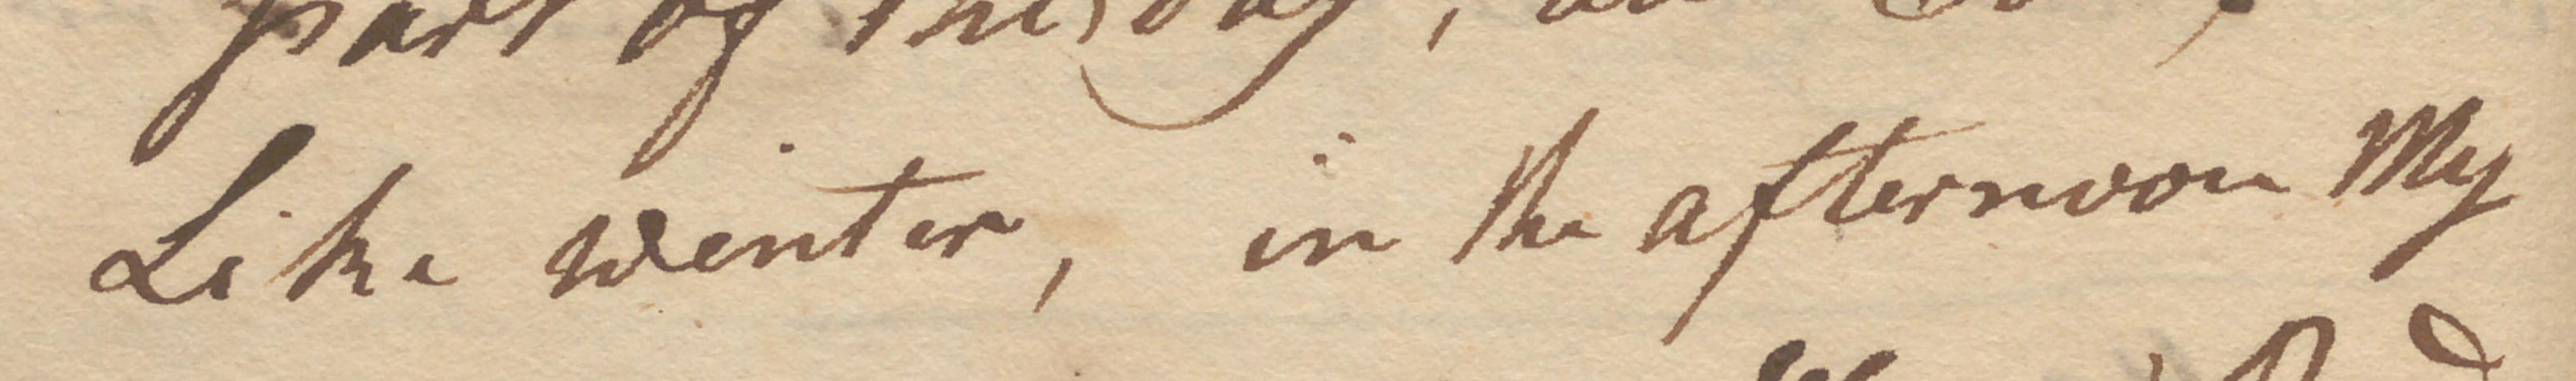Like winter, in the afternoon My
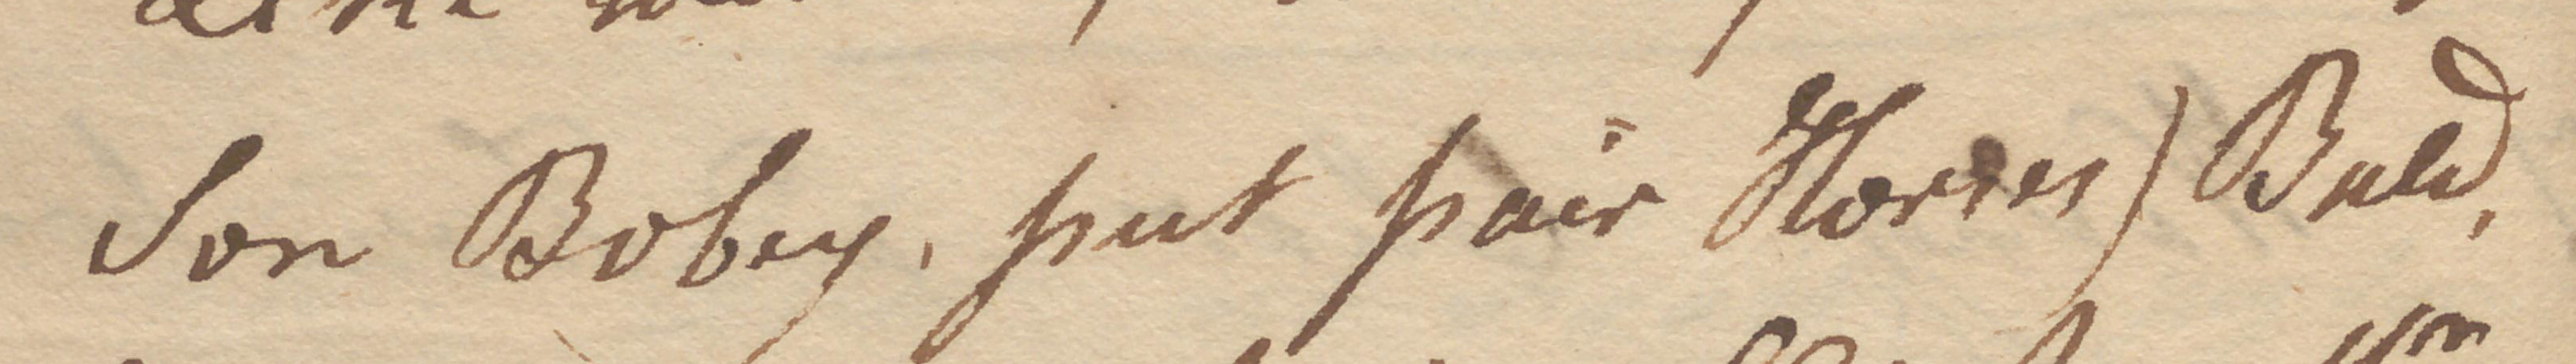Son Bobey, put pair Horses) Bald
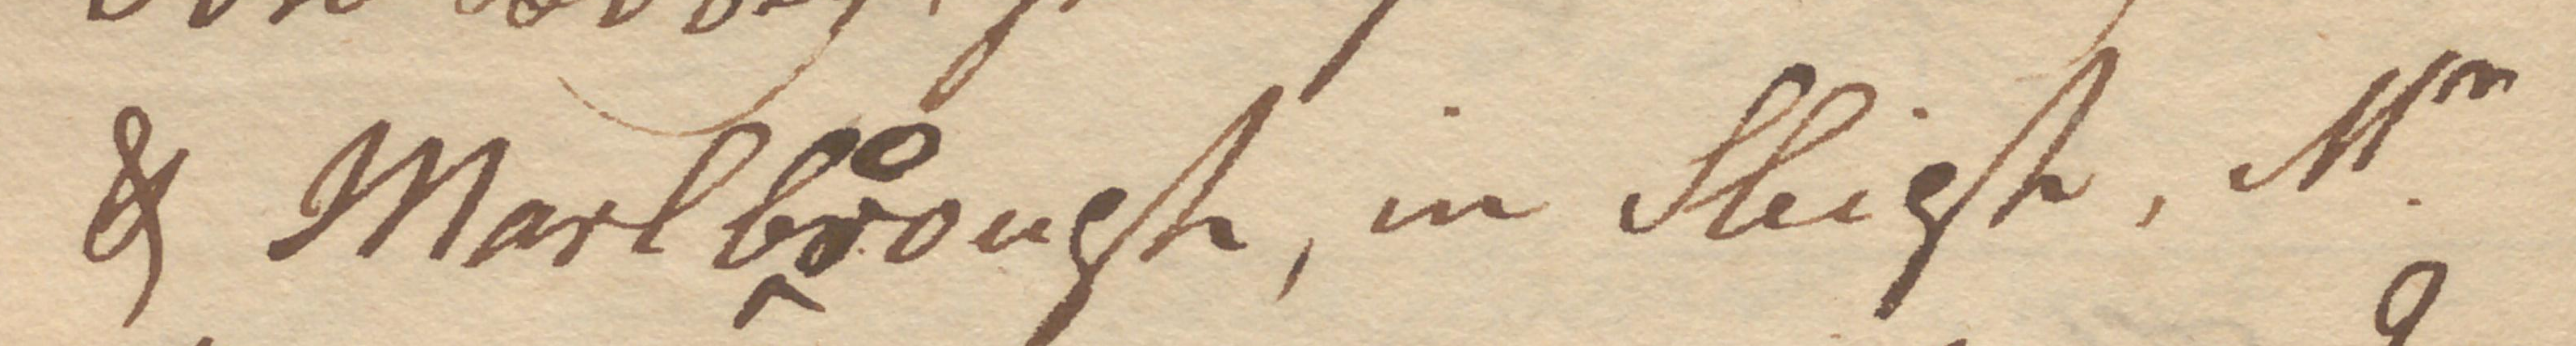& Marlb^orough in Sleigh, M^r.
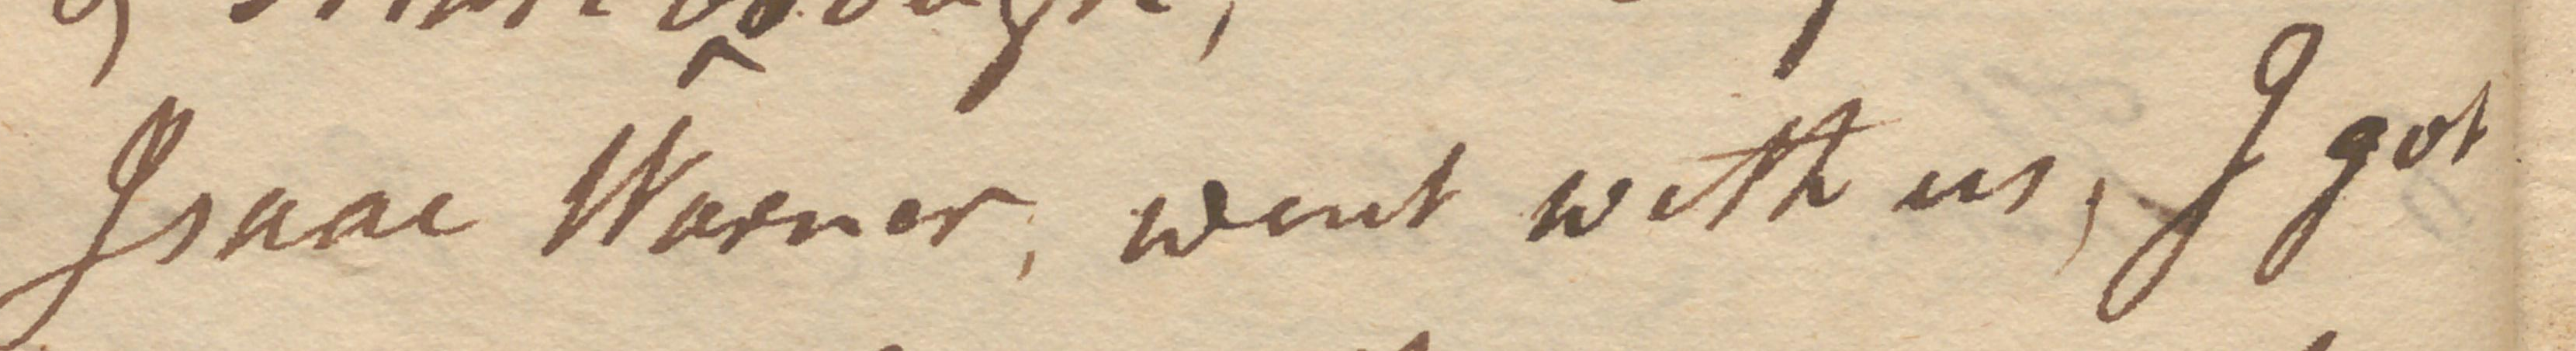Isaac Warner went with, I got
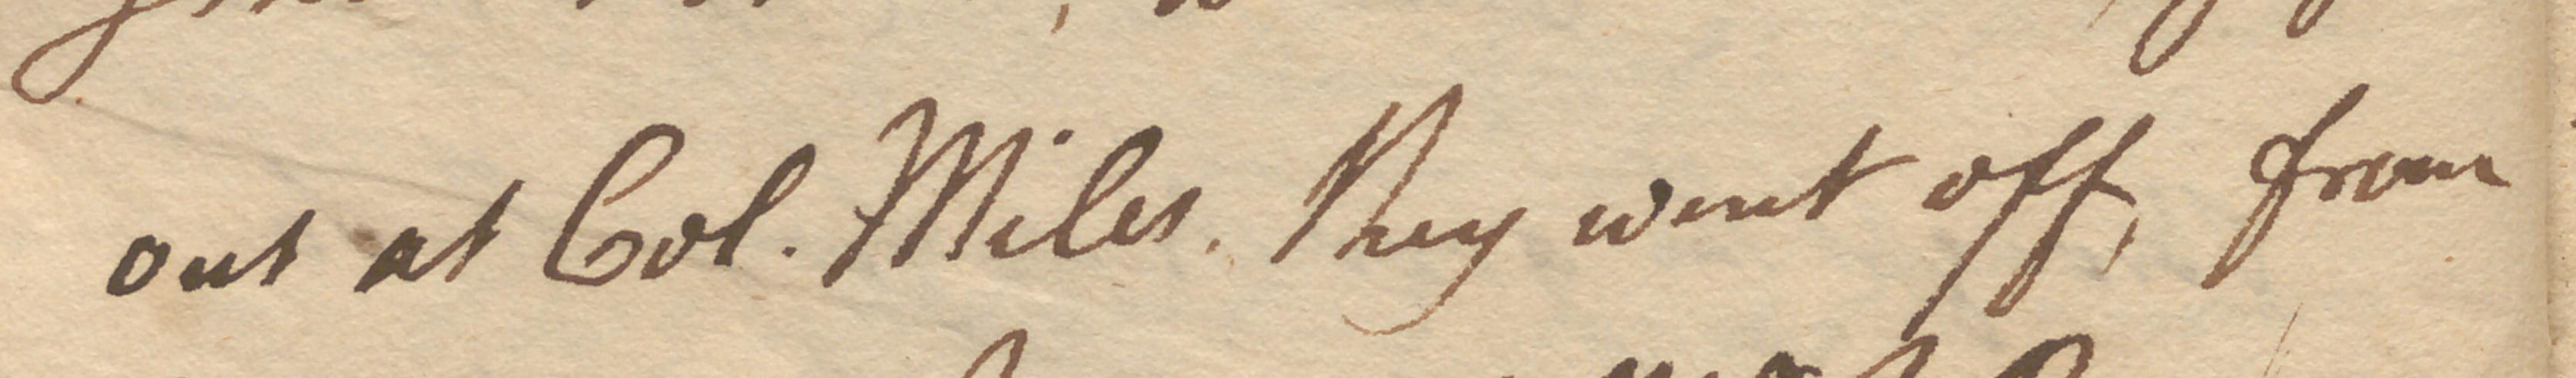out at Col. Miles. they went off from
